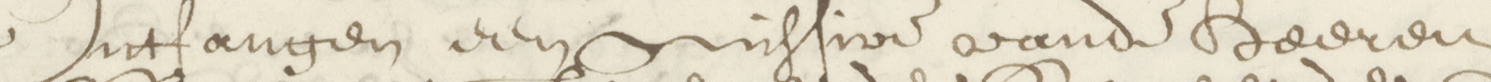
Ontfangen een Missive vande Heeren
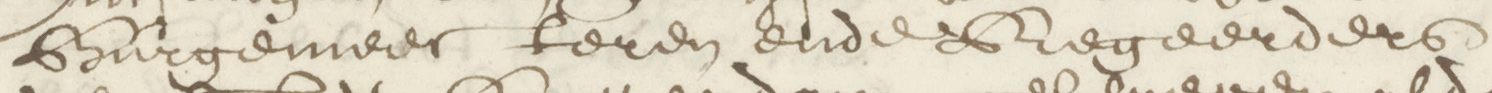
Burgemeesteren ende Regeerders
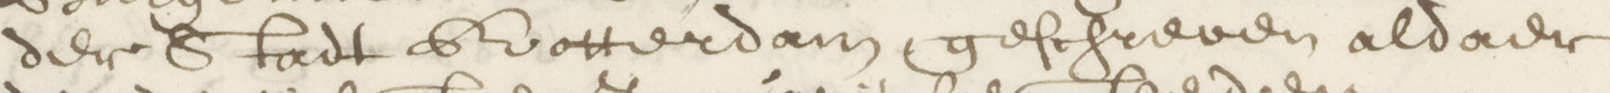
der Stadt Rotterdam geschreven aldaer
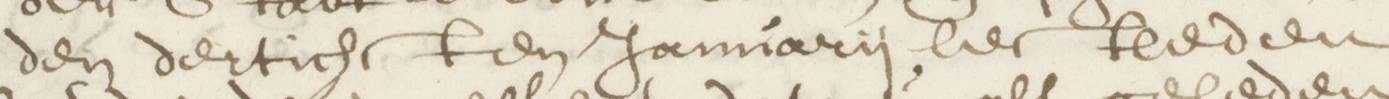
den dertichsten Januarij lestleden
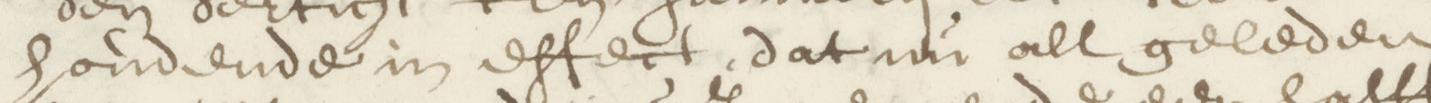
houdende in effect, dat nu all geleden
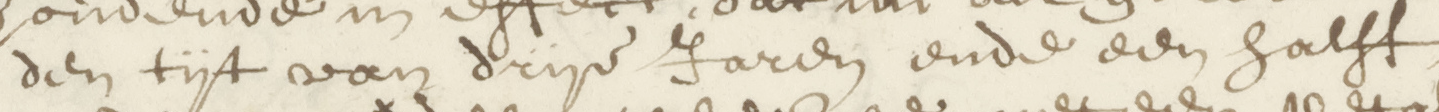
den tijt van drije Jaren ende een halff
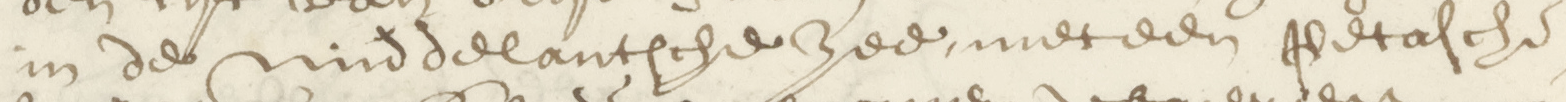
in de Middelantsche Zee met een Petasche
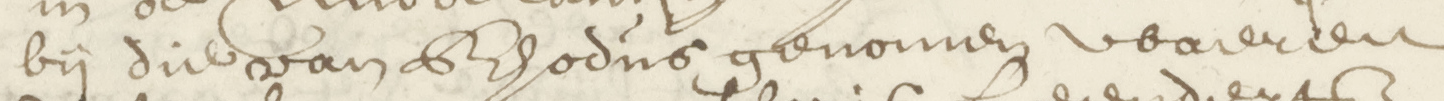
bij die van Rhodus genomen waeren
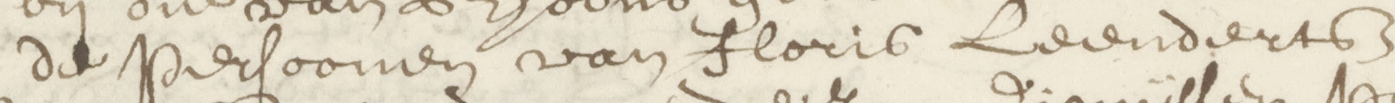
de Persoonen van floris Leendertsz
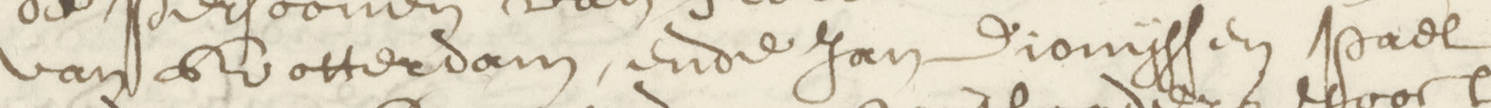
van Rotterdam, ende Jan Dionijssen Pael
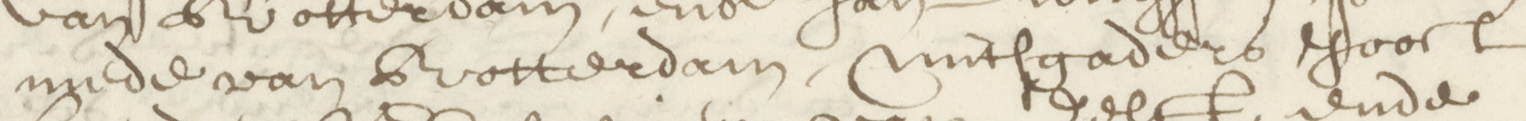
mede van Rotterdam, mitsgaders Joost
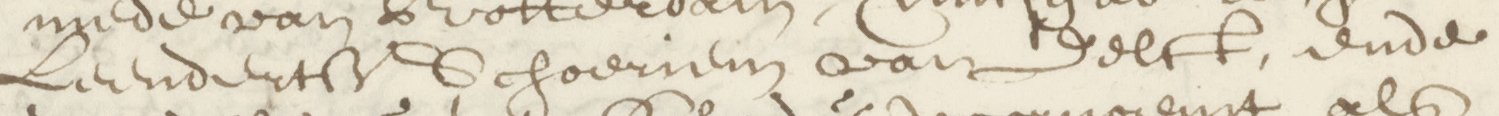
Leendertsz Schoeriem van Delft, ende
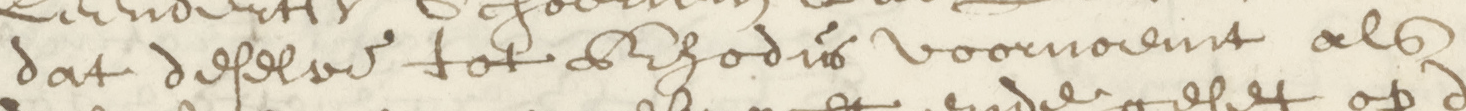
dat deselve tot Rhodus voornoemt als
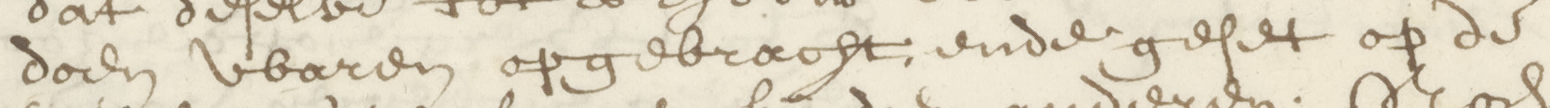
doen waren opgebracht ende geset op de
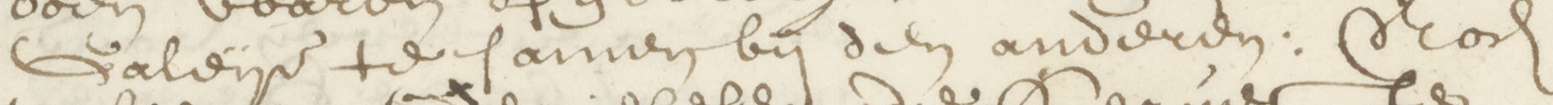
Galeije te samen bij den anderen: Noch
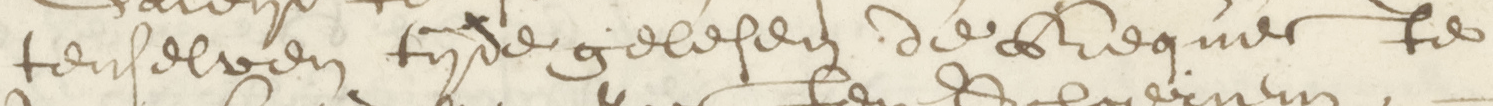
tenselven tijde gelesen de Requeste
